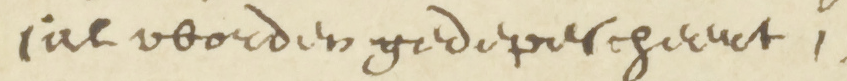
sal worden gedepescheert.
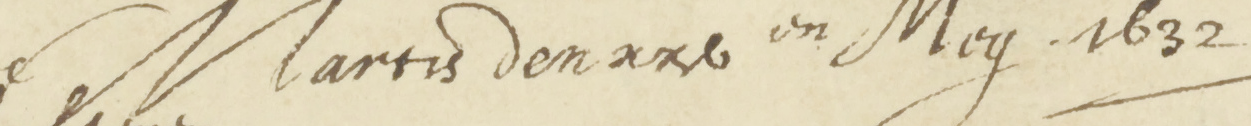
Martis den xxven Mey 1632.
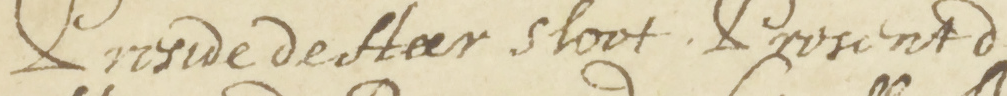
Preside de Heer Sloot. Present de
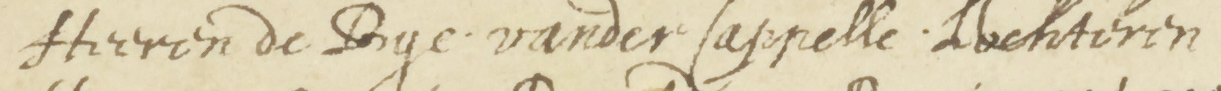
Heeren de Bye. vander Cappelle. Lochteren
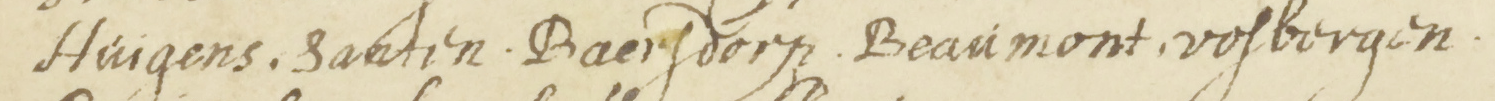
Huigens. Santen. Baersdorp. Beaumont. Vosbergen.
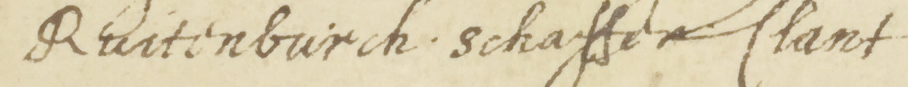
Ruitenburch. Schaffer Clant
